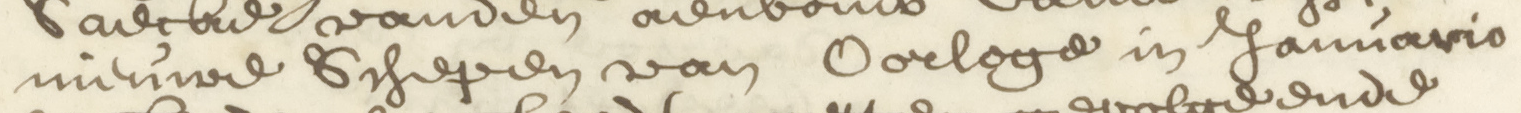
nieuwe Schepen van Oorloge in Januario
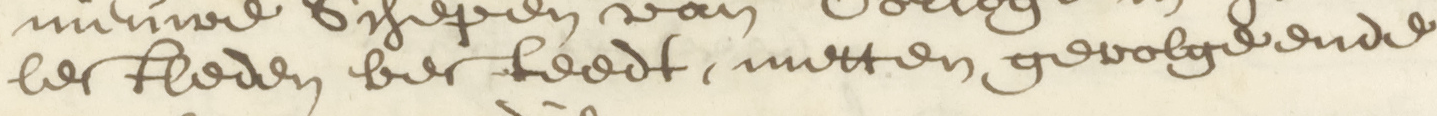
lestleden besteedt, metten gevolge ende
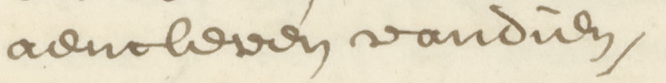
aencleven vandien.
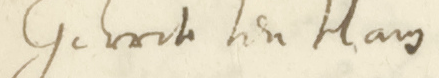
Gerrit ten Ham
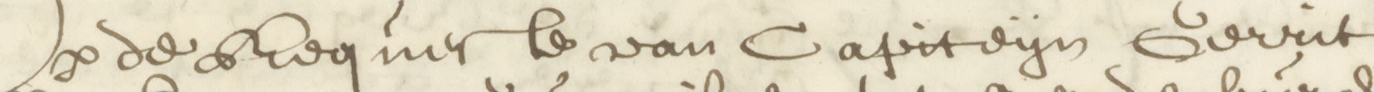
Op de Requeste van Capiteijn Gerrit
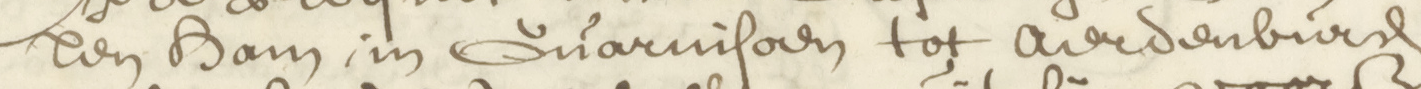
ten Ham, in Guarnisoen tot Aerdenburch,
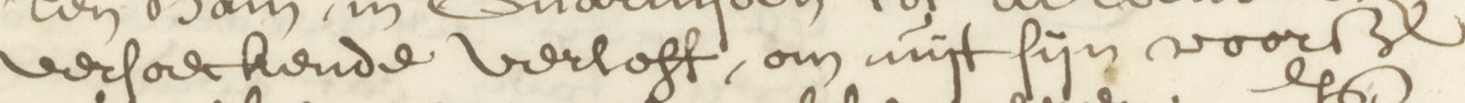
versoeckende verloff, om uijt sijn voorss.
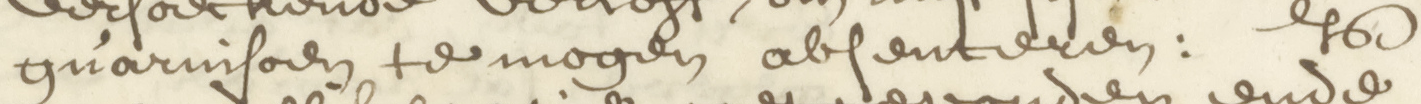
guarnisoen te mogen absenteren: Is
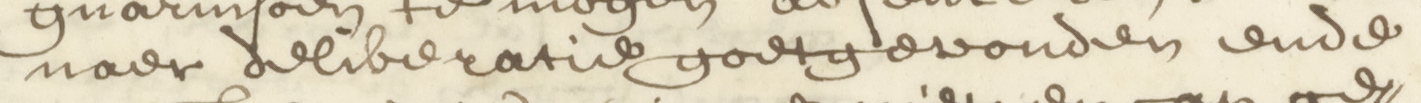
naer deliberatie goetgevonden ende
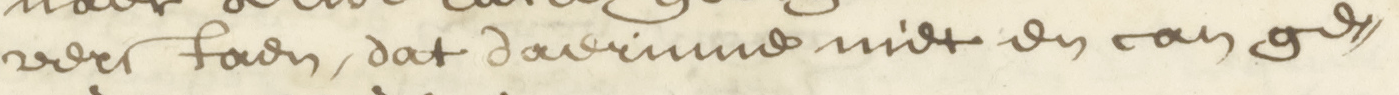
verstaen, dat daerinne niet en can ge„
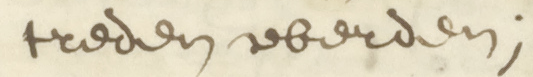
treden werden;
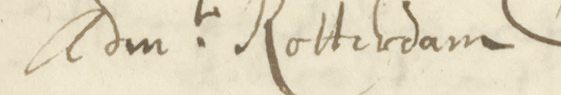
Admt. Rotterdam
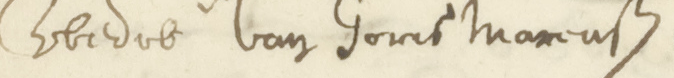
Wedwe van Goris Marcusz
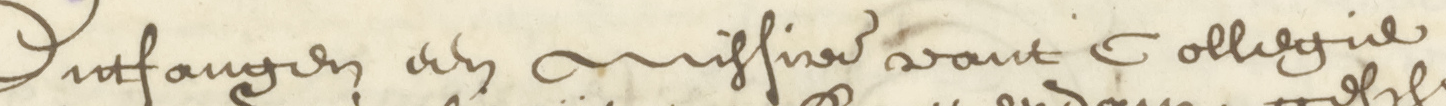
Ontfangen een Missive vant Collegie
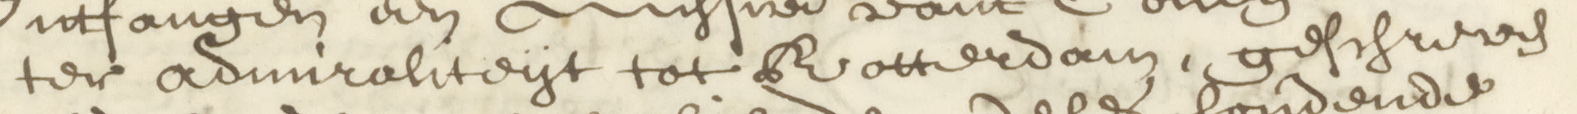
ter admiraliteijt tot Rotterdam, geschreven
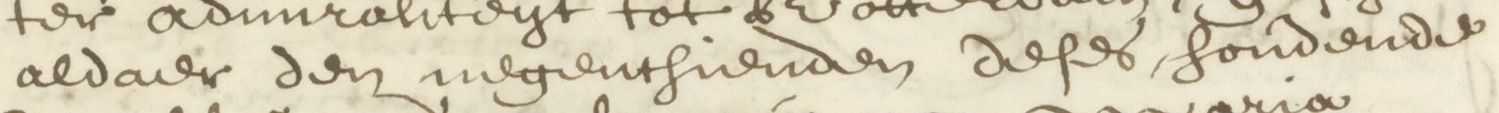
aldaer den negenthienden deses, houdende
